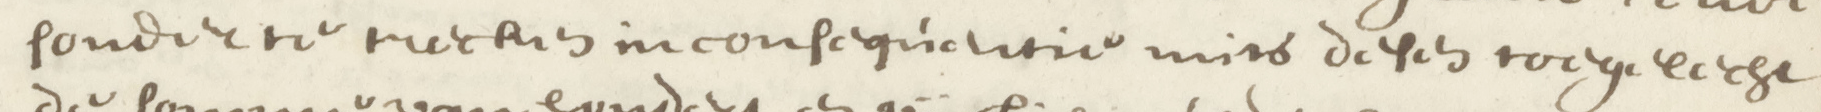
sonder te trecken in consequentie mits desen toegelecht
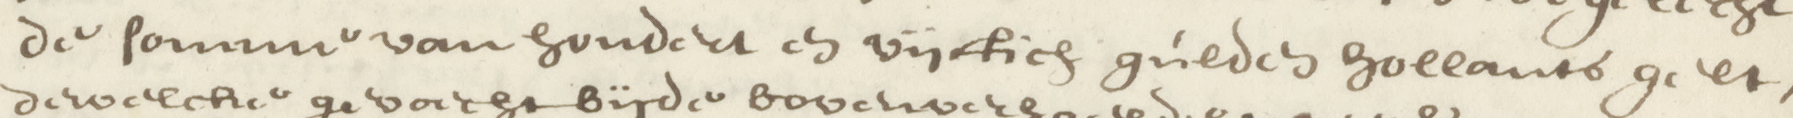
de somme van hondert en vijftich gulden hollants gelt,
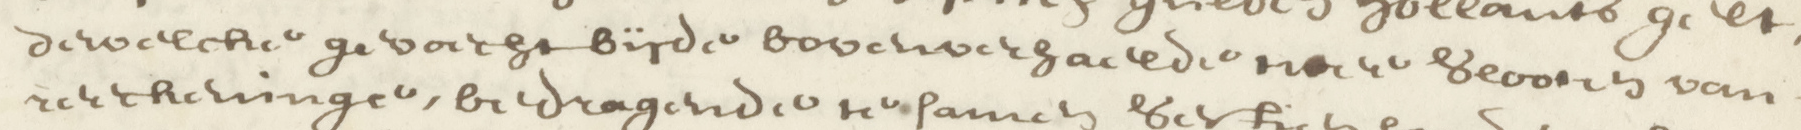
dewelcke gevoecht bijde bovenverhaelde twee Slooten van
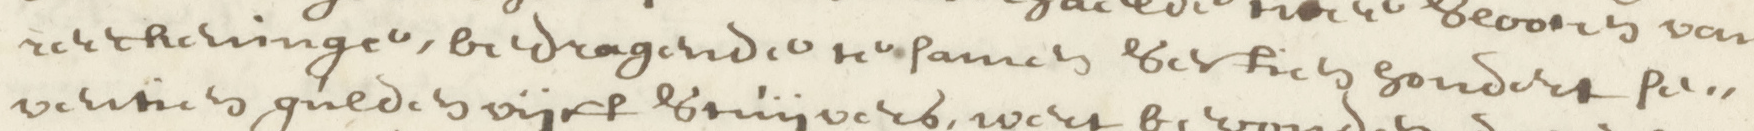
reeckeninge, bedragende te samen Sestien hondert se„
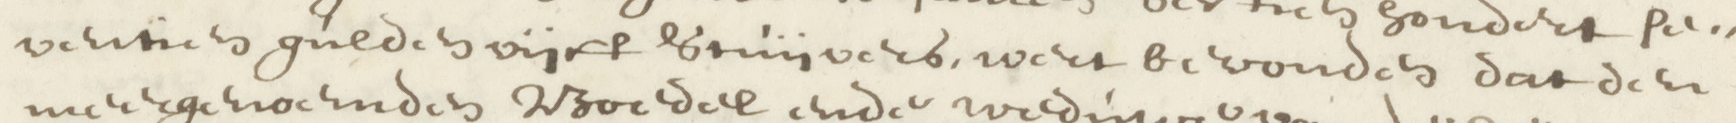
ventien gulden vijff Stuijvers, wert bevonden dat den
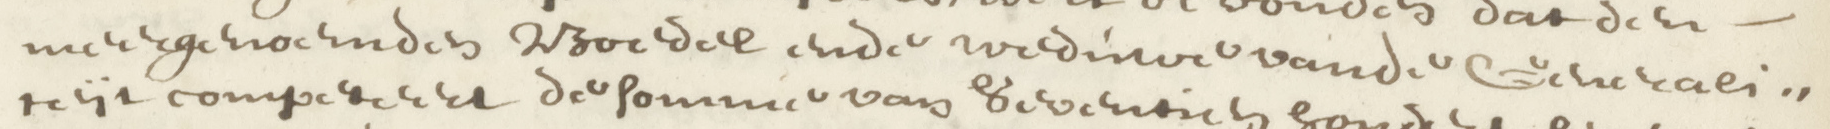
meergenoemden Boedel ende weduwe vande Generali„
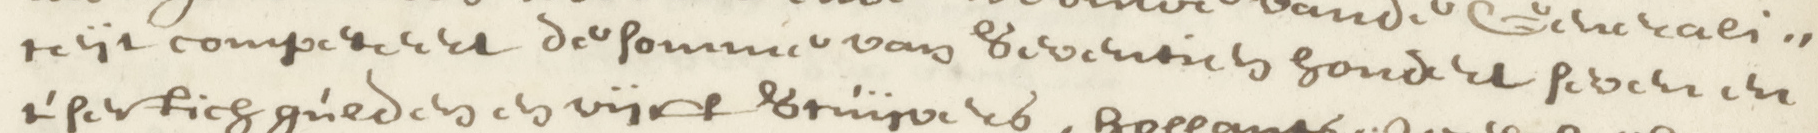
teijt competeert de somme van Seventien hondert seven en
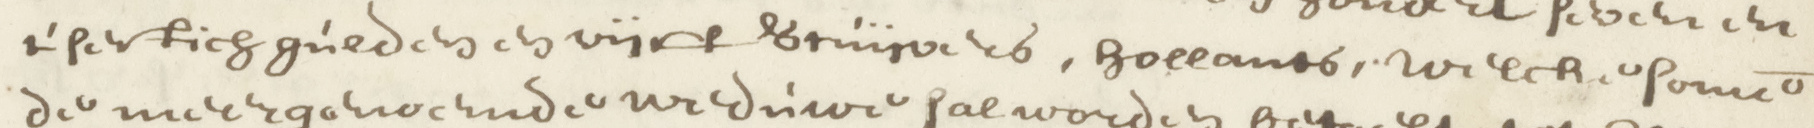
t'sestich gulden en vijff stuijvers, hollants, welcke somme
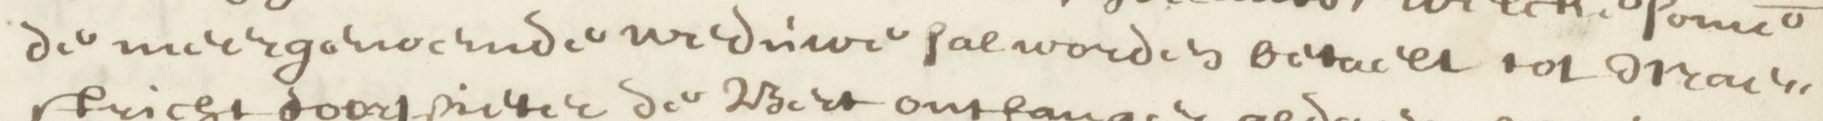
de meergenoemde weduwe sal worden betaelt tot Mae„
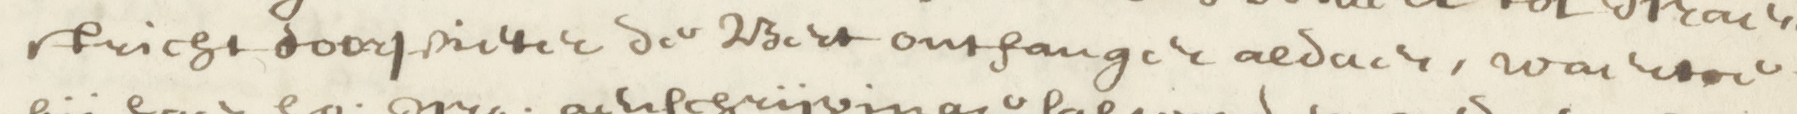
stricht door Pieter de Bert ontfanger aldaer, waertoe
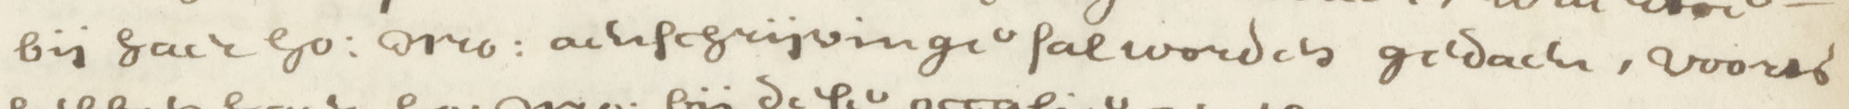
bij haer Ho:Mo: aenschrijvinge sal worden gedaen, voorts
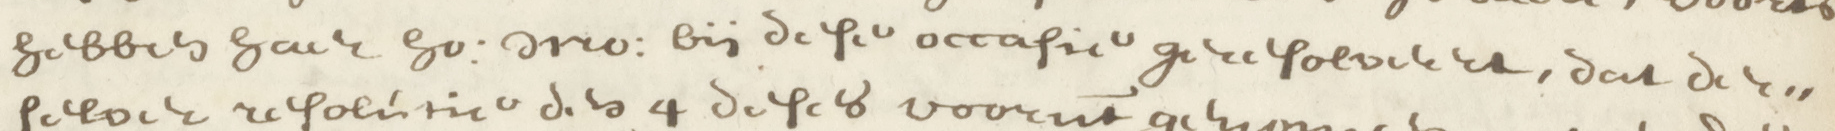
hebben haer Ho:Mo: bij dese occasie geresolveert, dat der„
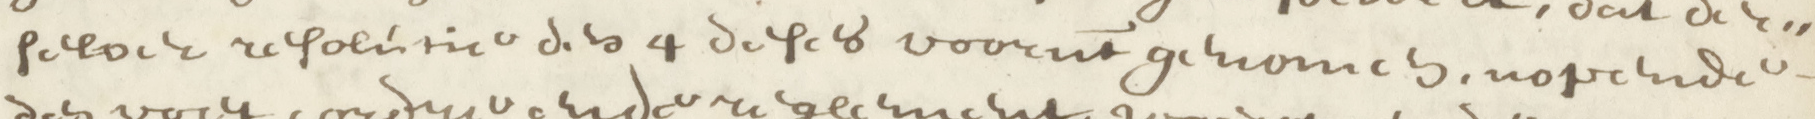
selver resolutie der 4 deses voornt genomen, nopende
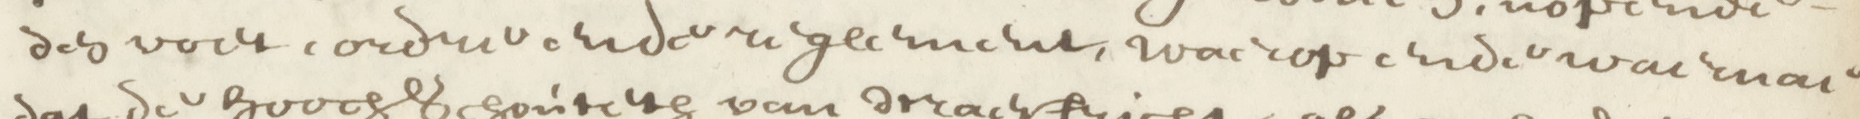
den voet, ordre ende reglement, waerop ende waernae
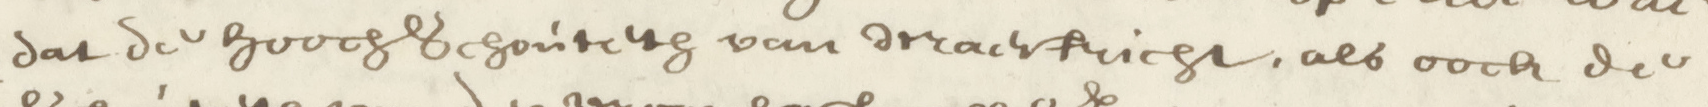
dat de hoochschouteth van Maestricht, als oock de
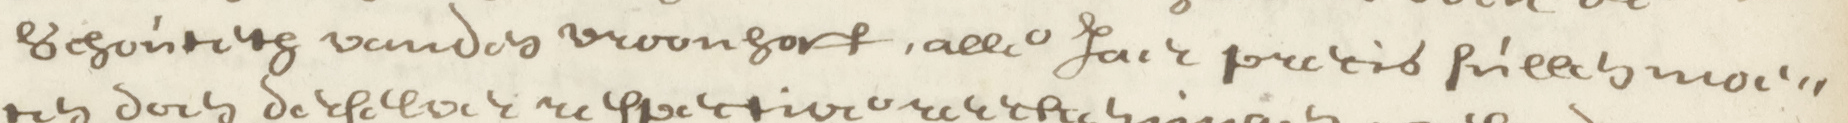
Schouteth vanden vroonhoff, alle jaer precis sullen moe„
